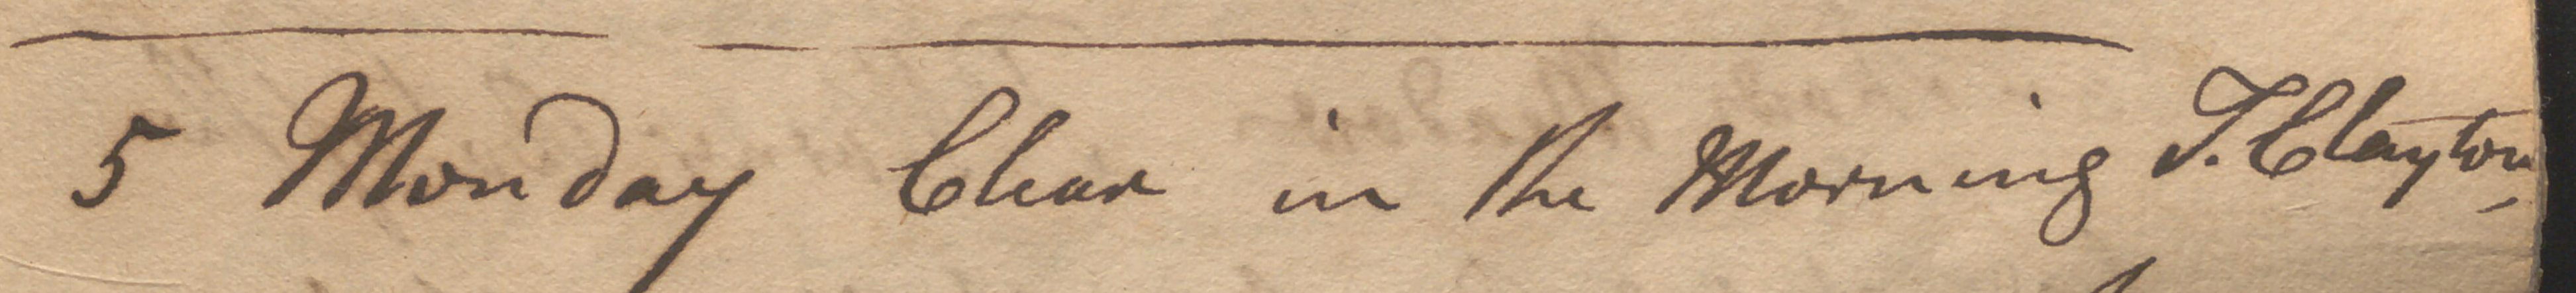5 Monday Clear in the Morning J. Clayton
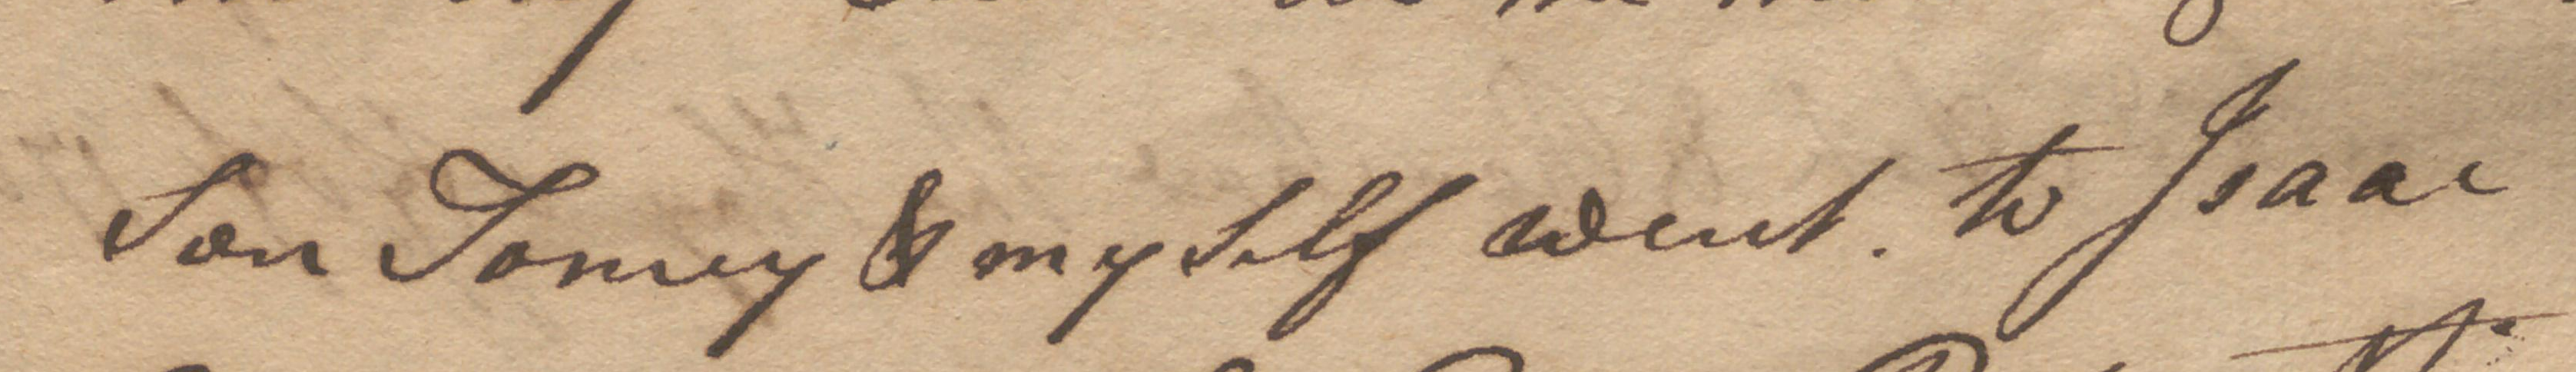Son Tomey & myself went to Isaac
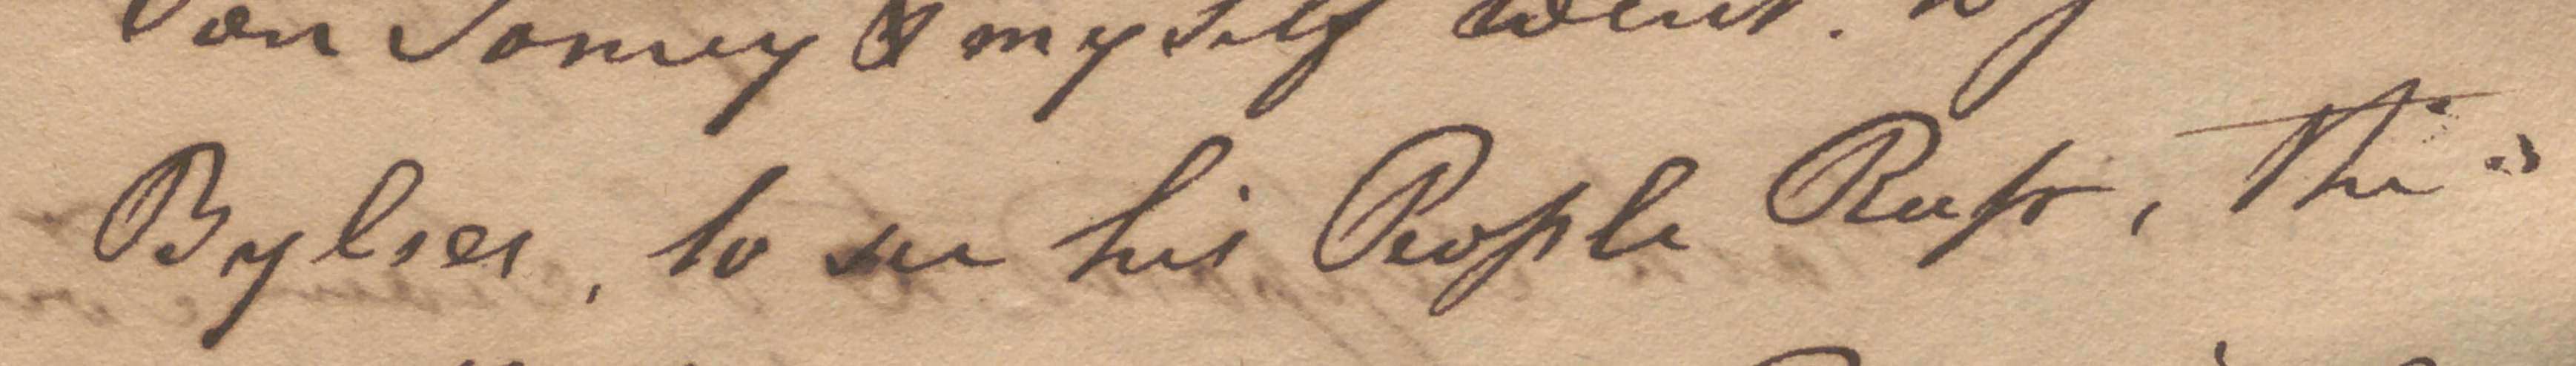Bylies to see his People Reep, the
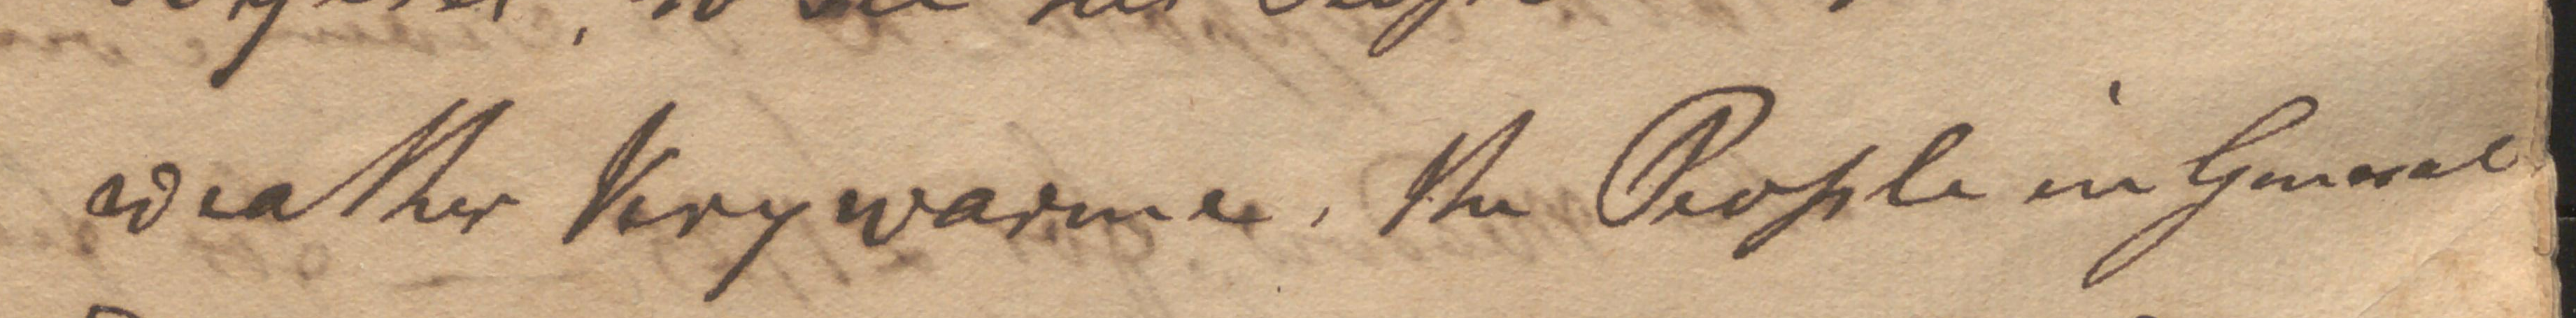weather Very warme. the People in Genaral
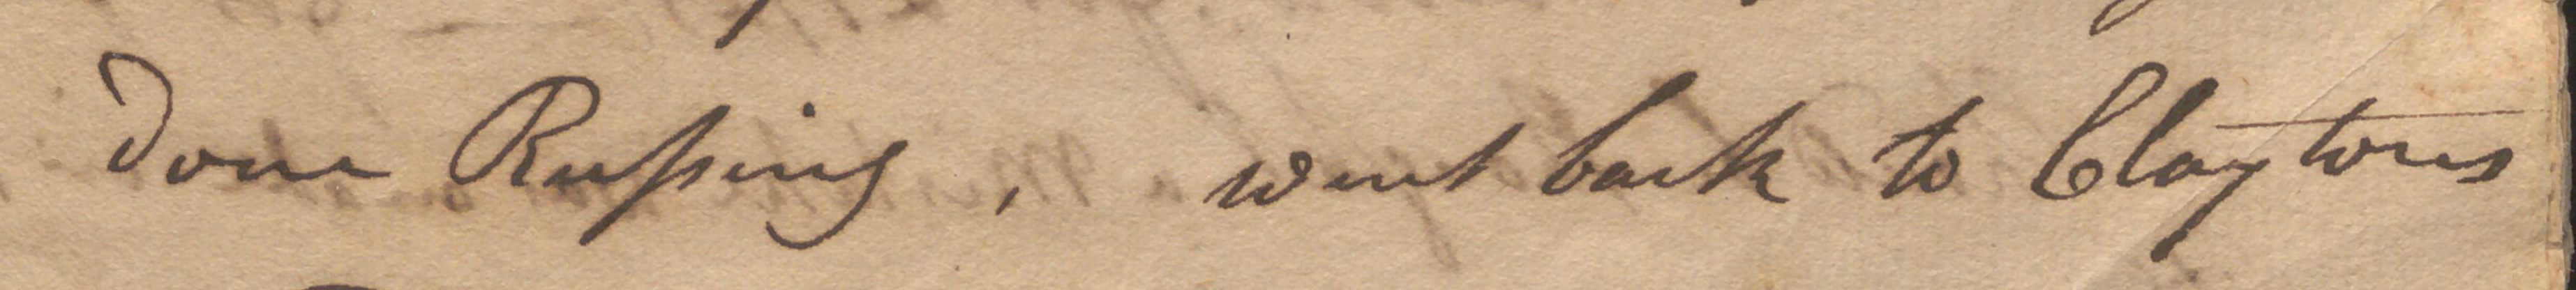done Reeping, went back to Claytors
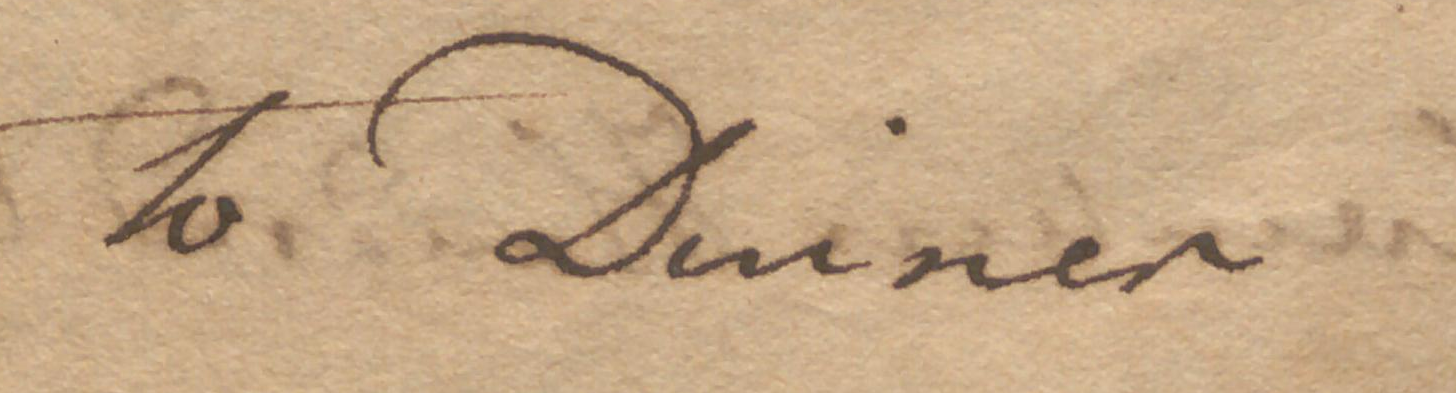to Dinner
